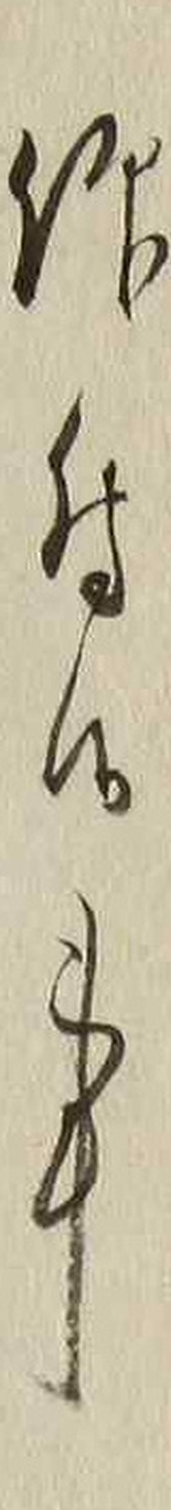仰付候事
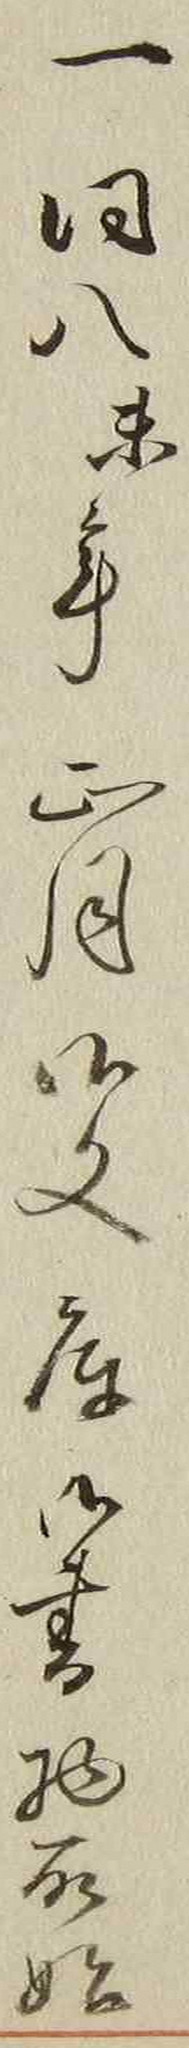一同八未年正月御文庫御書物所始
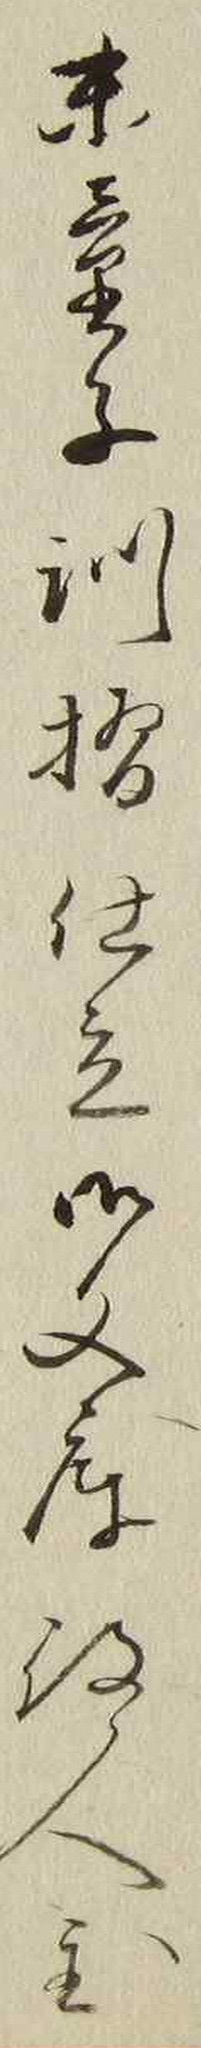末童子訓摺仕立御文庫役人へ主
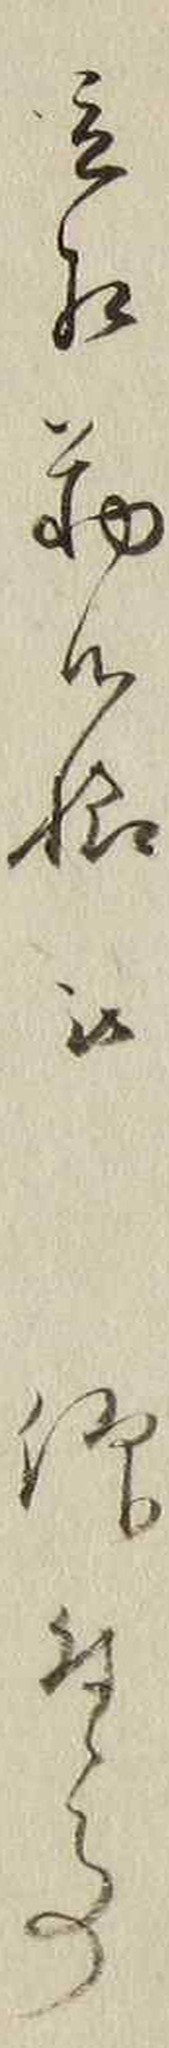立相勤候様被仰付候事
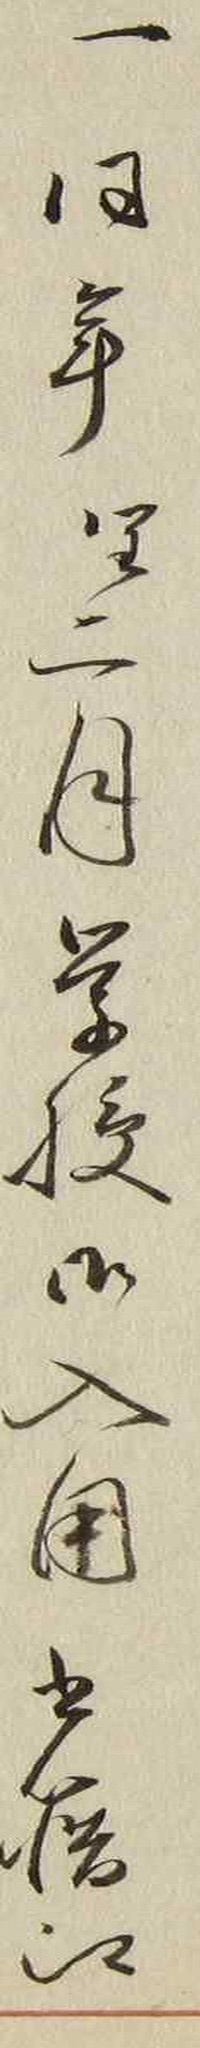一同年閏二月学校御入用書籍江
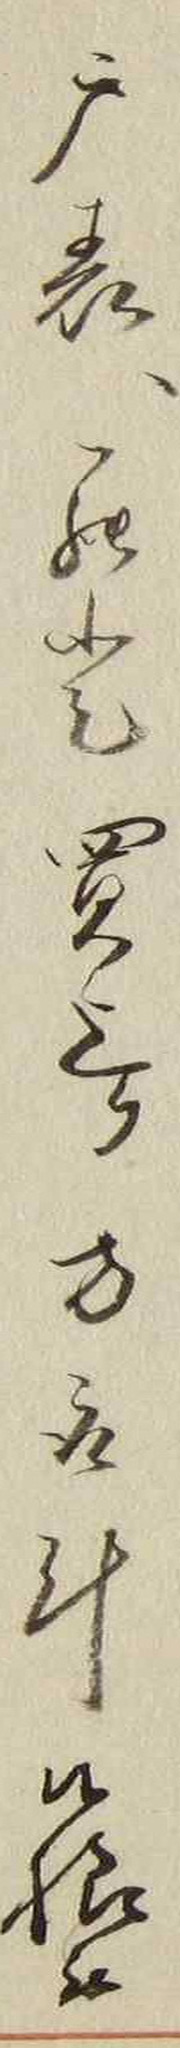戸表へ罷登買上ケ方取計候様被
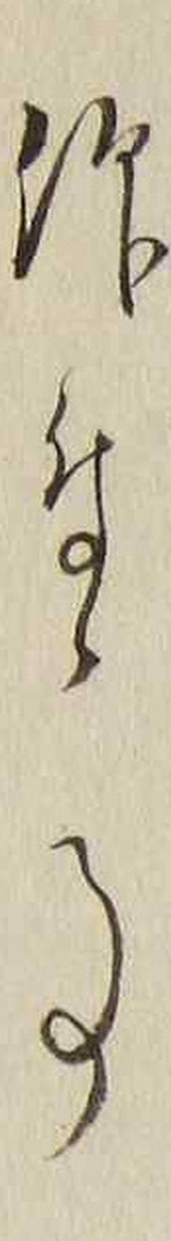仰付候事

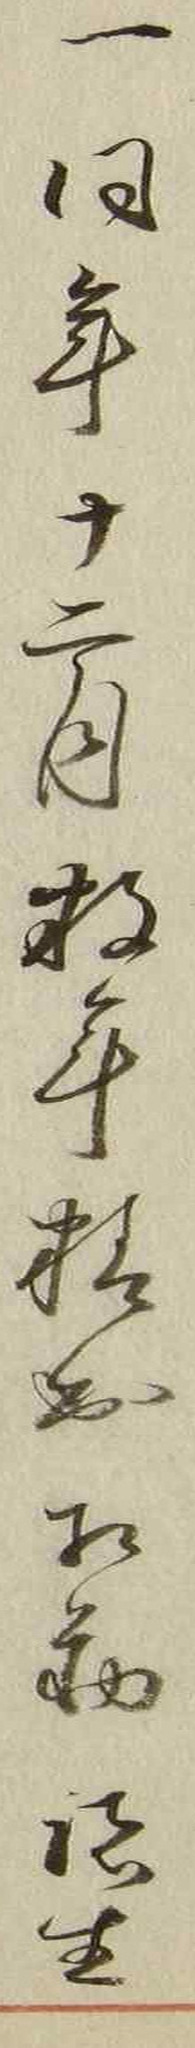一同年十二月数年精出相勤諸生
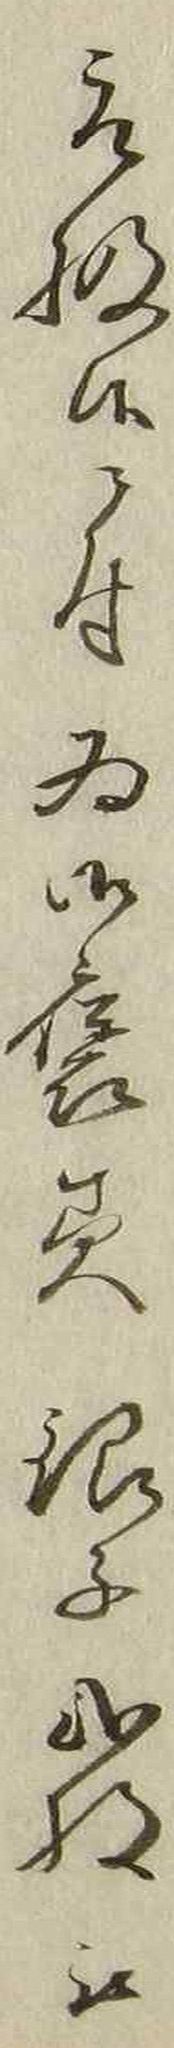取扱候ニ付為御褒美銀子弐枚被
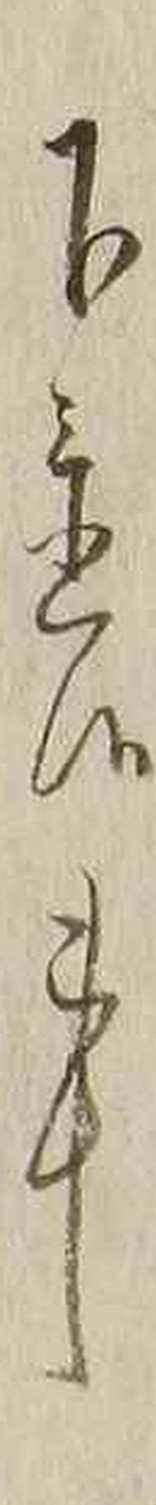下置候事
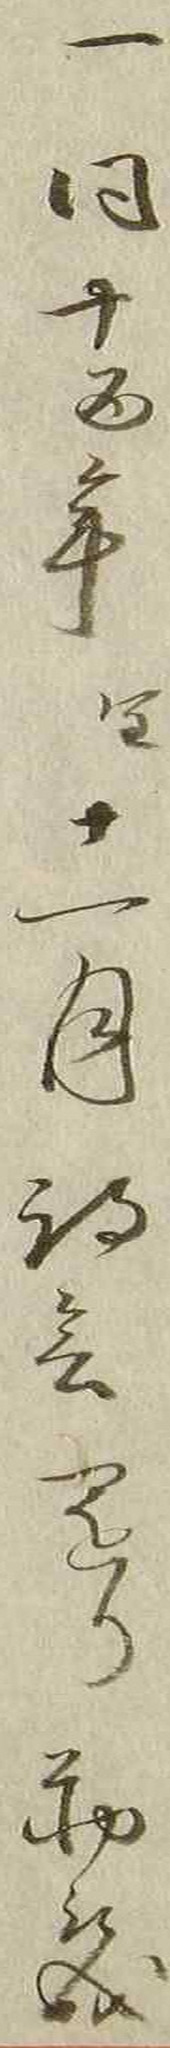一同十酉年閏十一月詩会懸り勤被成
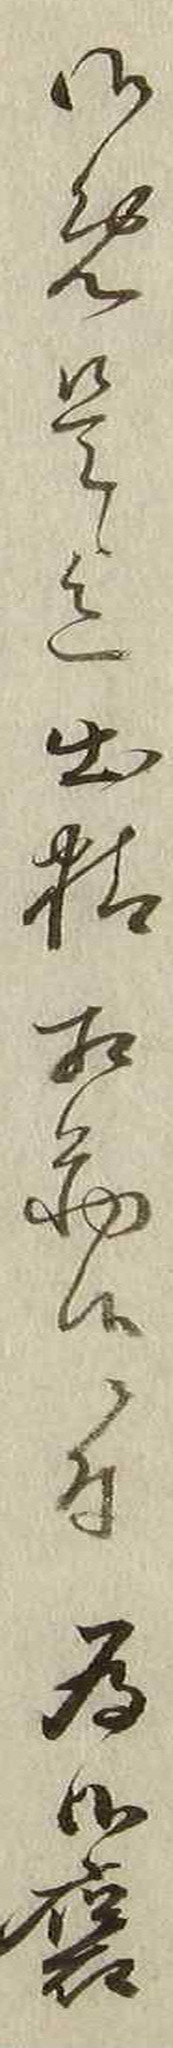御免是迄出精相勤候ニ付為御褒
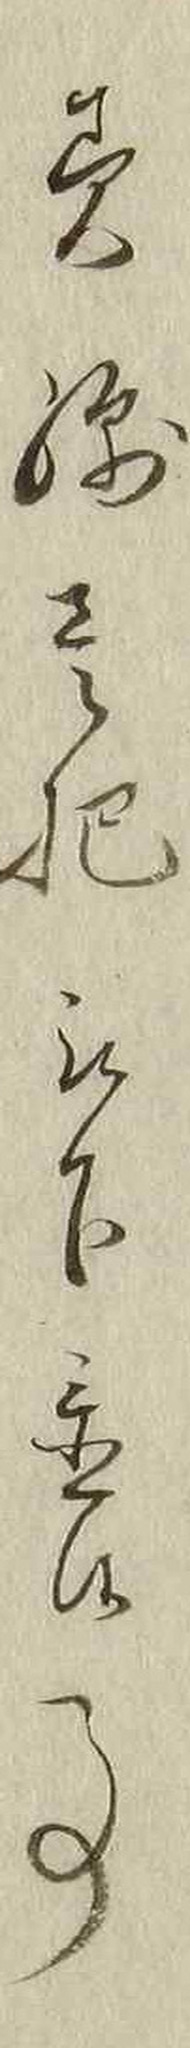美綿壱把被下置候事
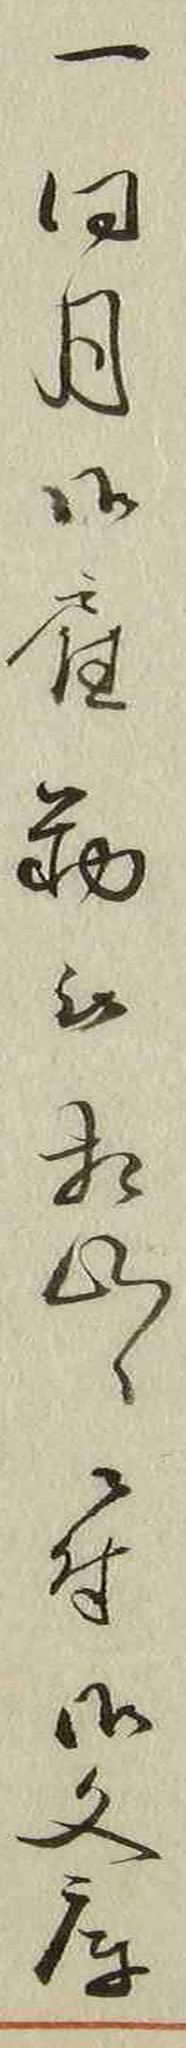一同月御雇勤被相止候ニ付御文庫
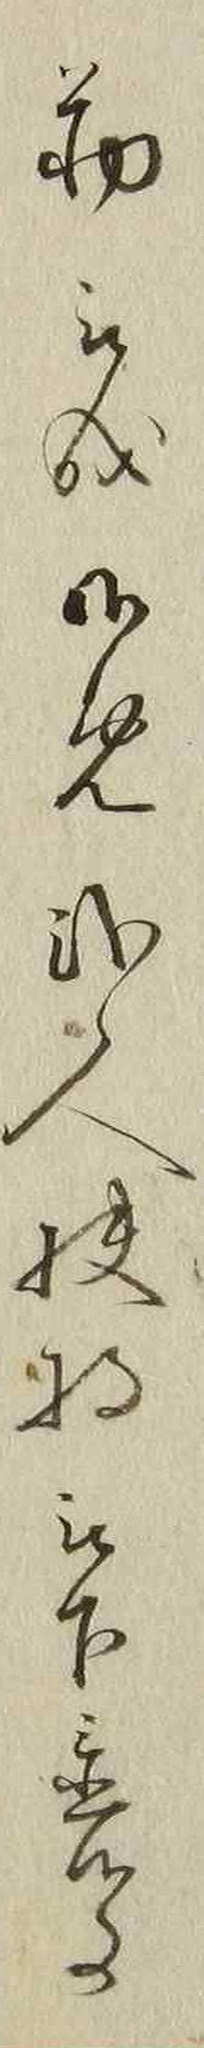勤被成御免弐人扶持被下置候事
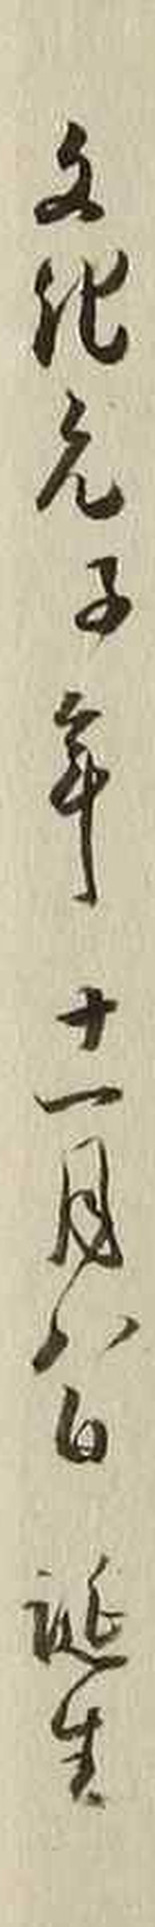文化元子年十一月八日誕生
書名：諸士系譜　巻之28　い之部28
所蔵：会津若松市立会津図書館
